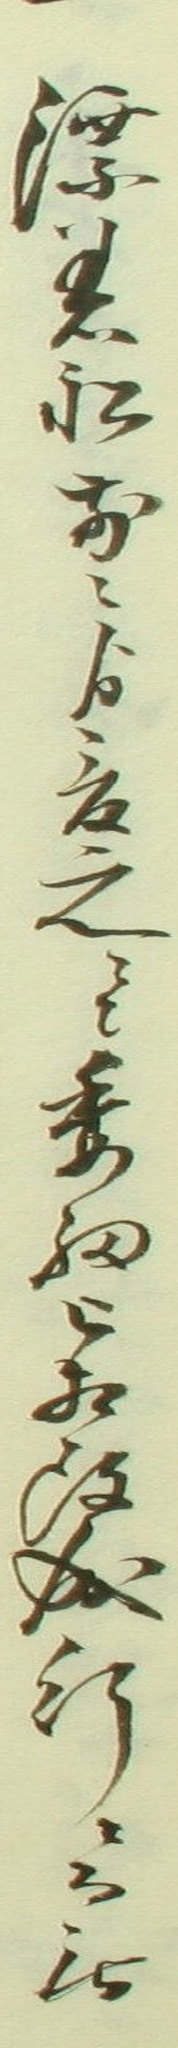一漂着船前々ゟ爰元二て委細被相改成行ニ而無
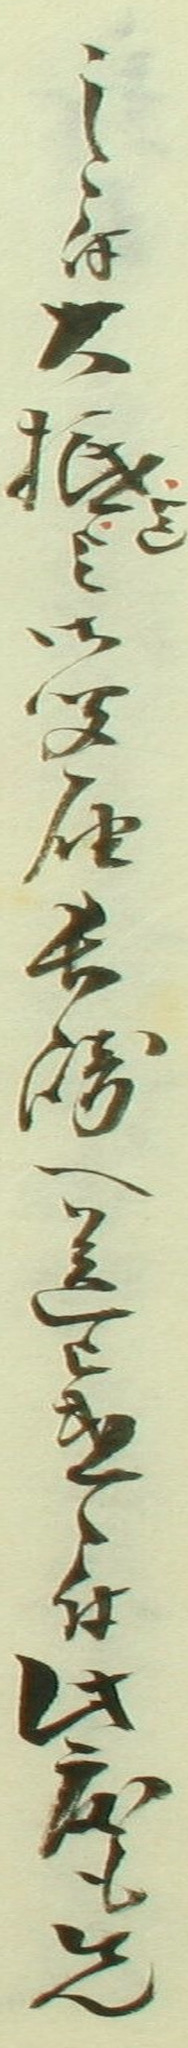之ニ付大抵与御聞届長崎へ送被遣候付此度も先
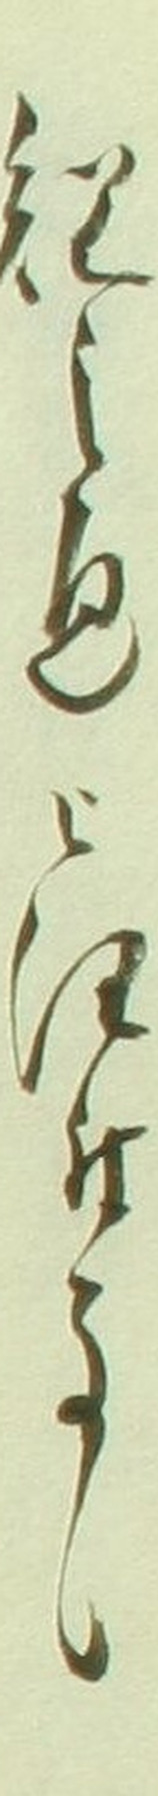規之通被仰付事候
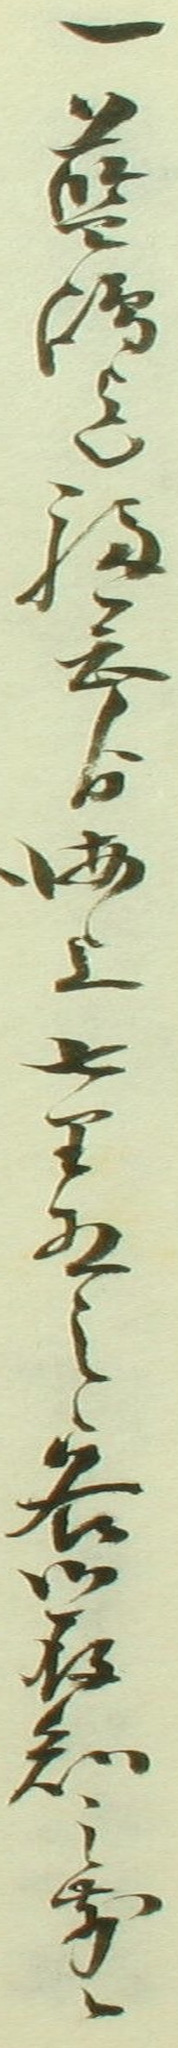一藍嶋迄福岡ゟ海上七里有之候各御存知之前候
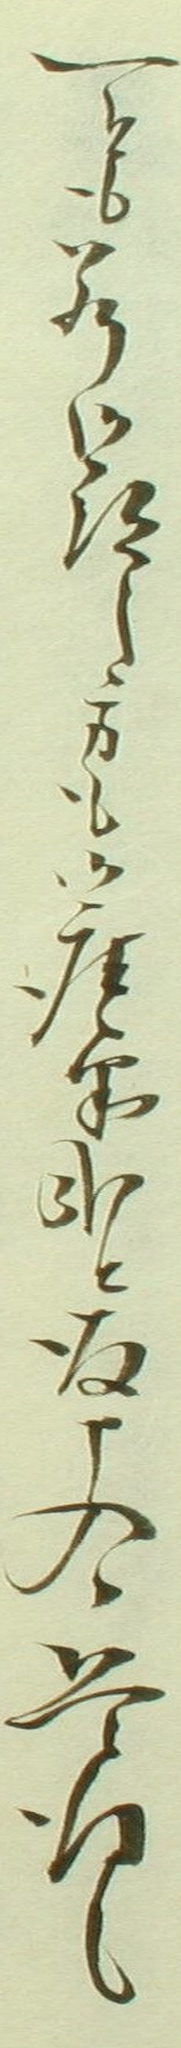へとも若御跡之方も御座候半哉と存申入候恐々謹言
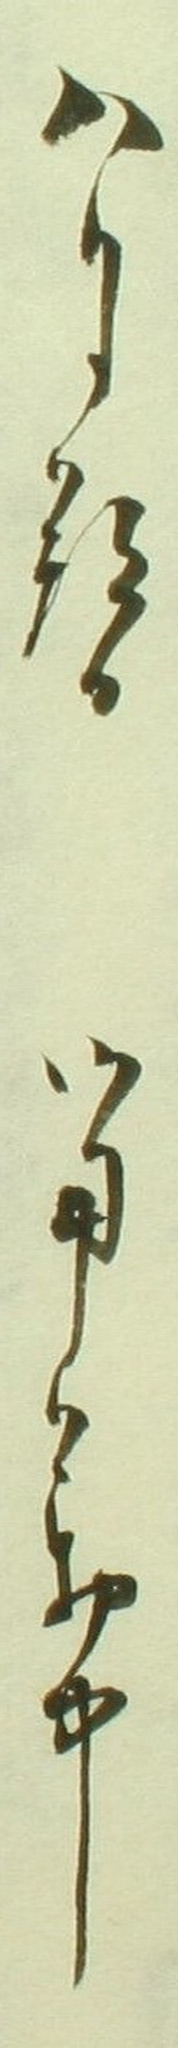八月朔日御用勤中
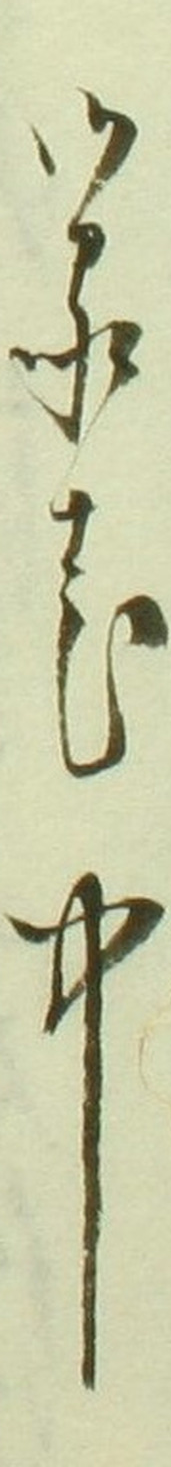御家老中
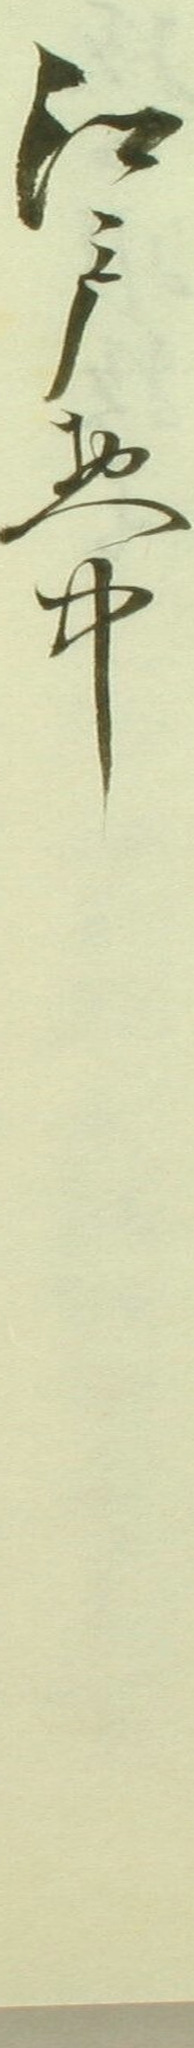江戸惣中
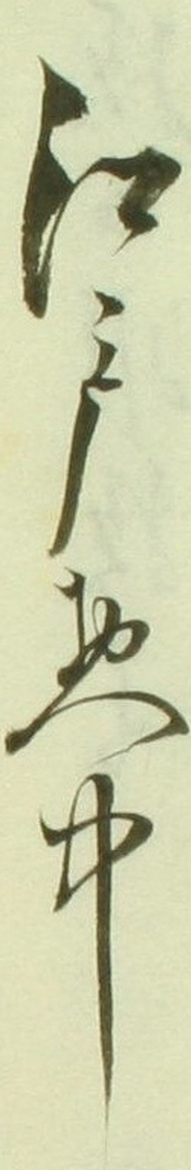江戸惣中
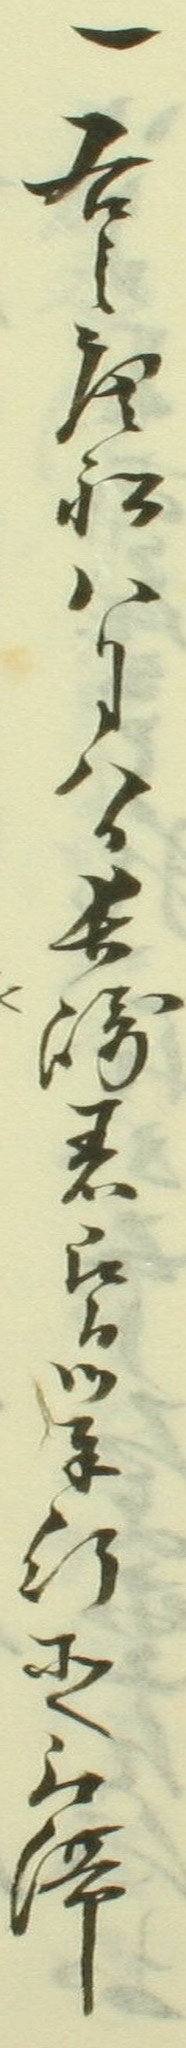一右之唐船八月八日長崎着即日御奉行所へ無滞
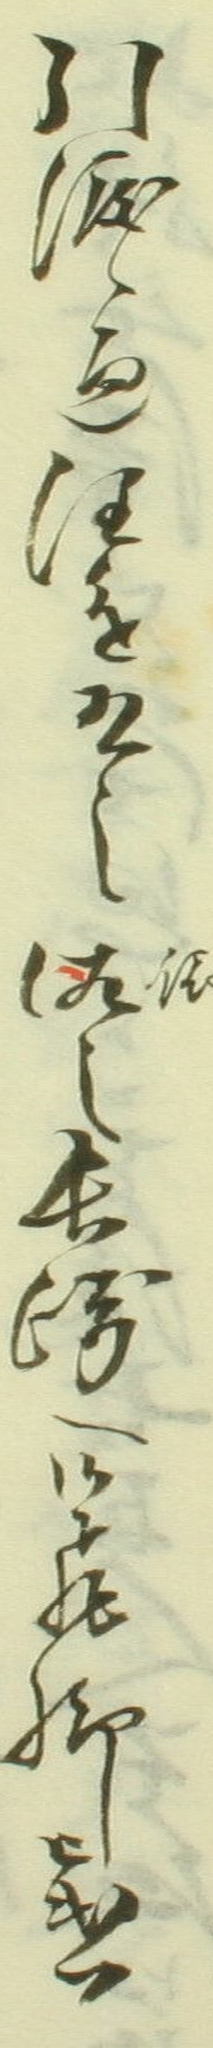引渡候通注進有之之長崎へ御飛脚被遣候
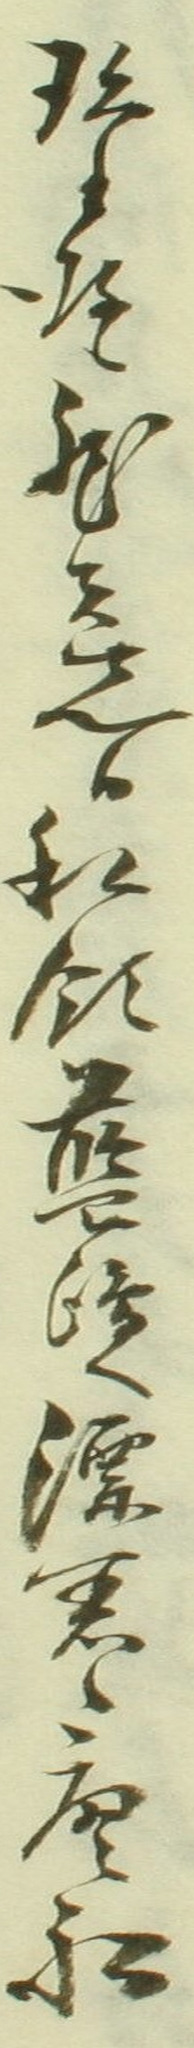珍重存候然者先日私領藍嶋へ漂着候唐船
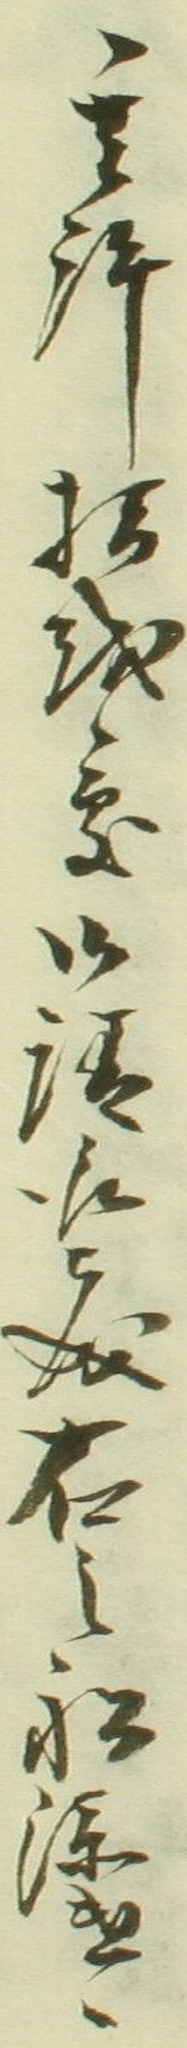其許指越候処御請取被成右之船添遣候
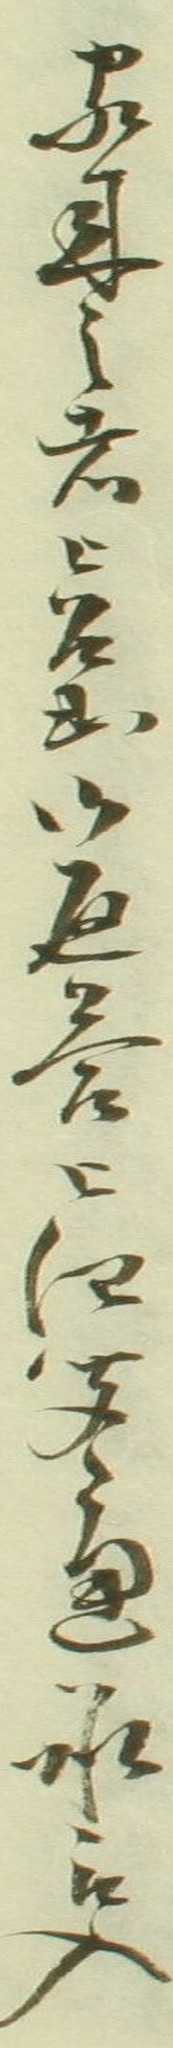家来之者被召出御返答被仰聞候通承被入
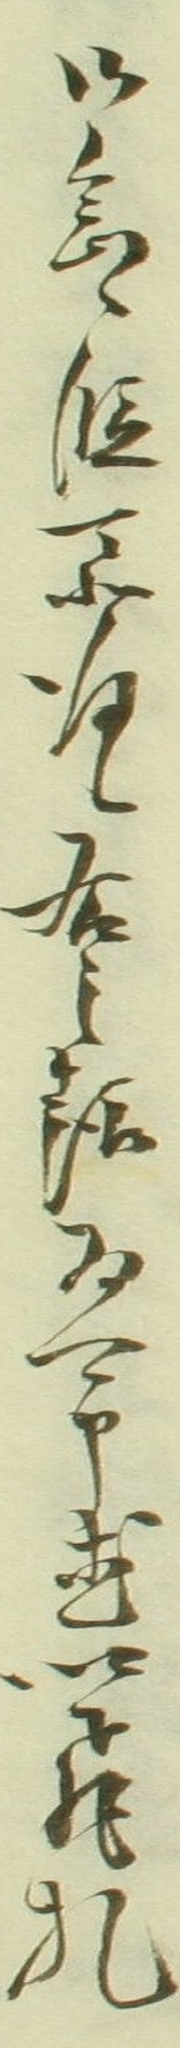御念候段忝存候右之趣為可申置以飛札
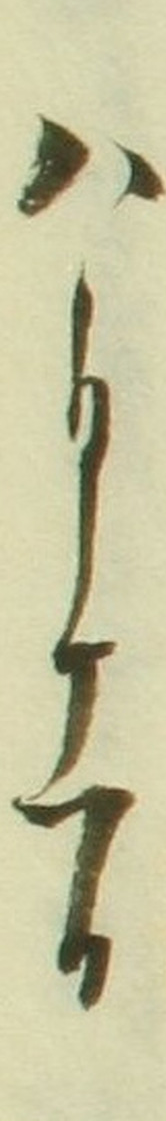八月十一日
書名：異国船漂着記
